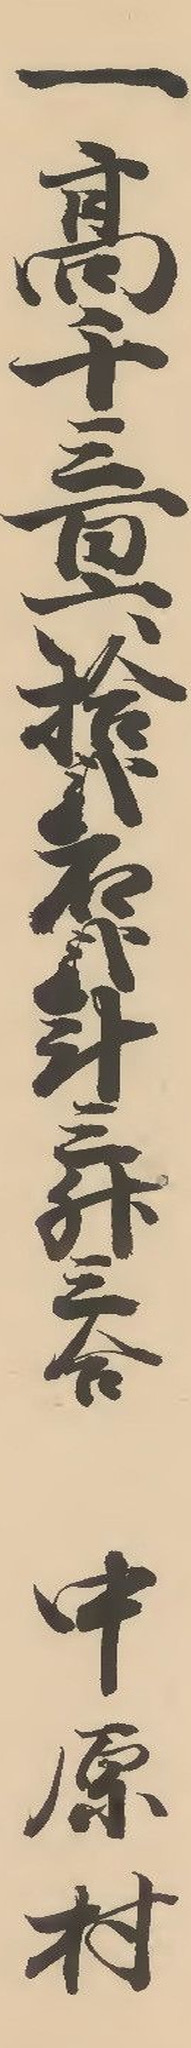一髙千三百六拾弐石弐斗三升三合中原村
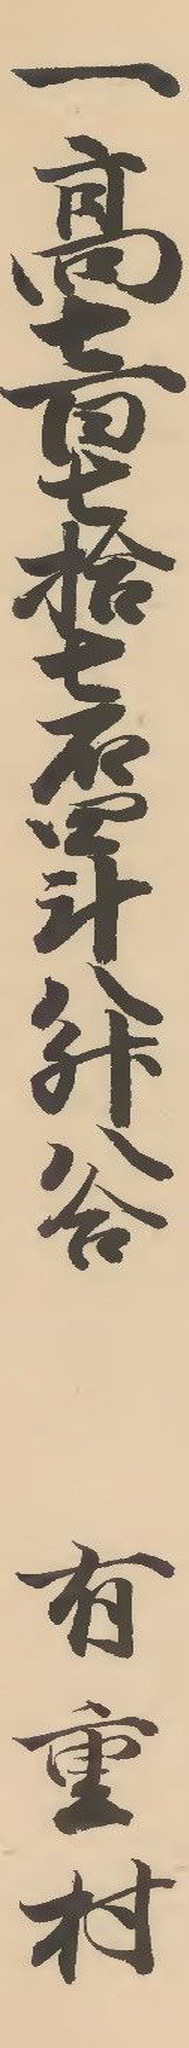一髙七百七拾七石四斗八升八合有重村

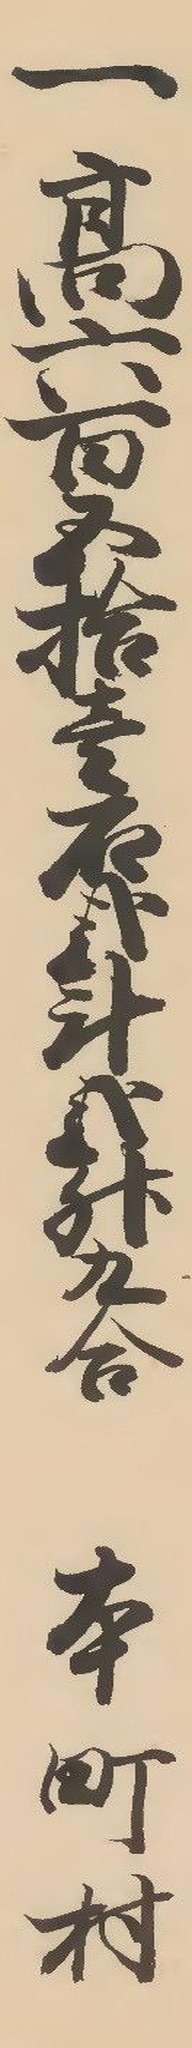一髙六百五拾壱石弐斗弐升九合本町村
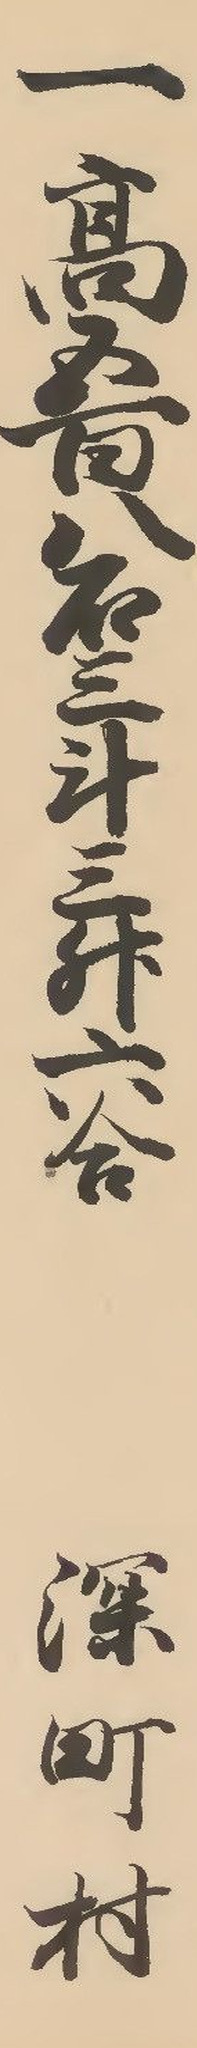一髙五百八石三斗三升六合深町村
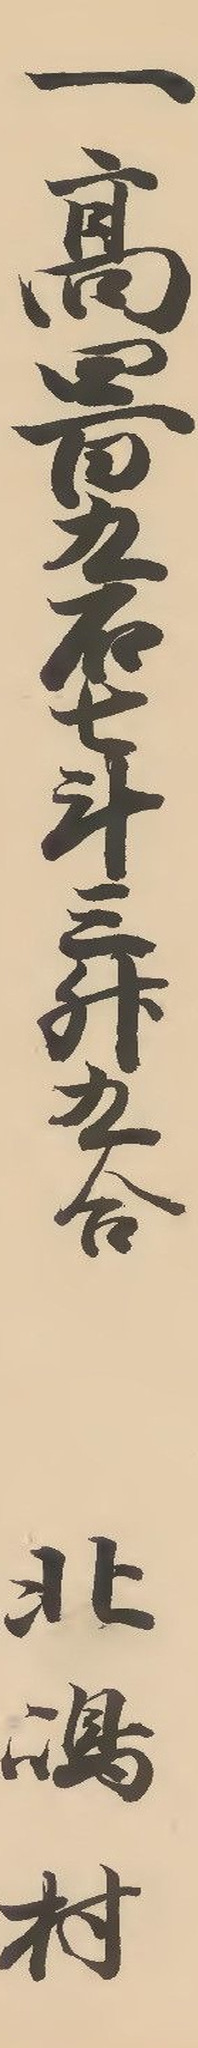一髙四百九石七斗三升九合北嶋村
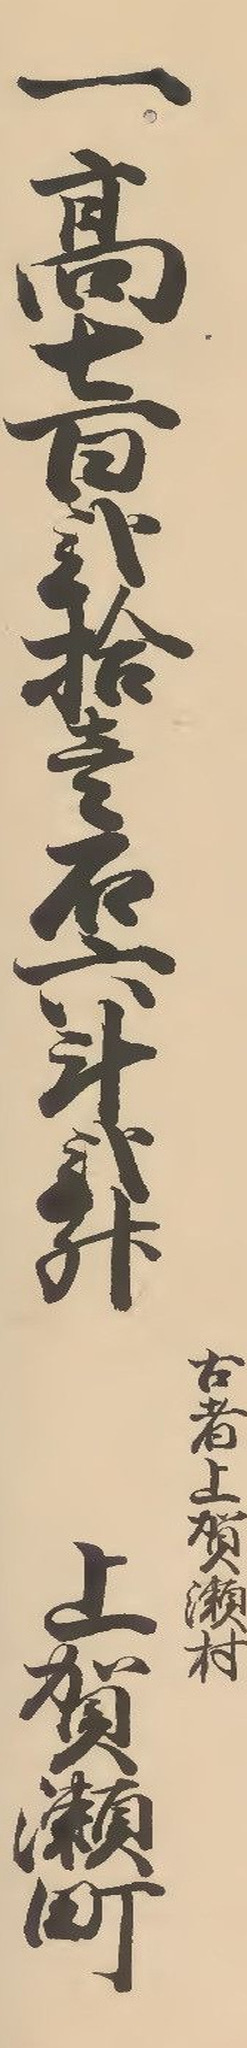一髙七百弐拾壱石六斗弐升上賀瀬町
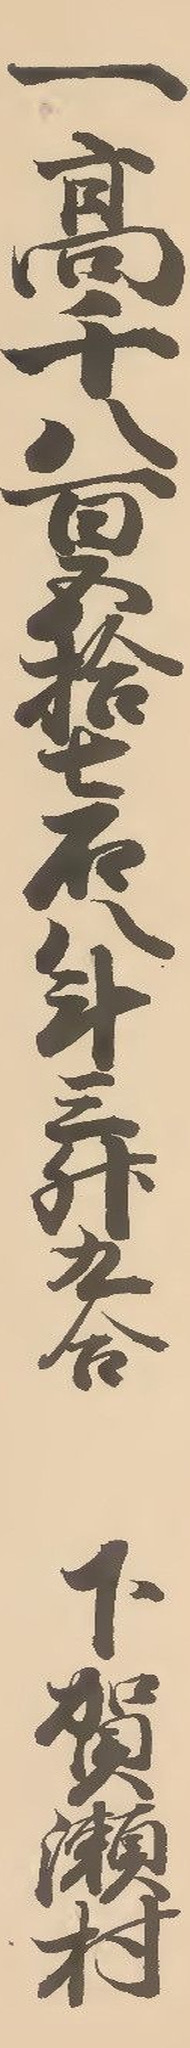一髙千八百五拾七石八斗三升九合下賀瀬村
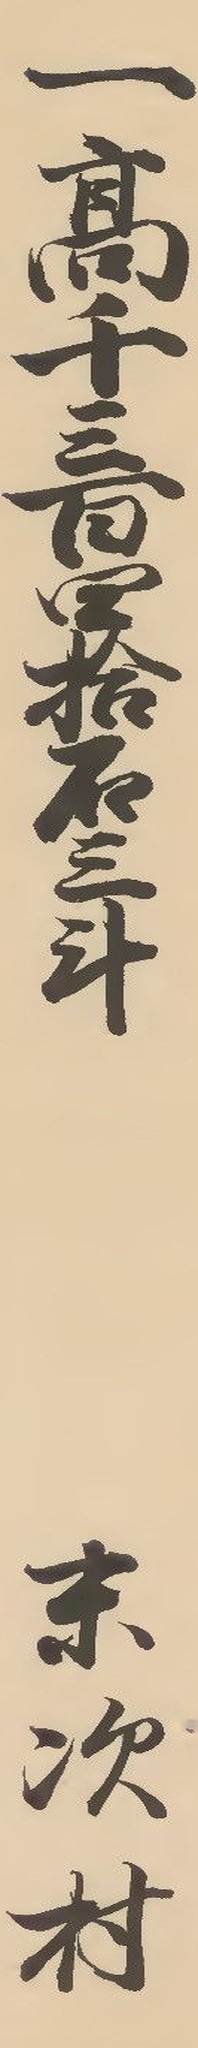一髙千三百四拾石三斗末次村
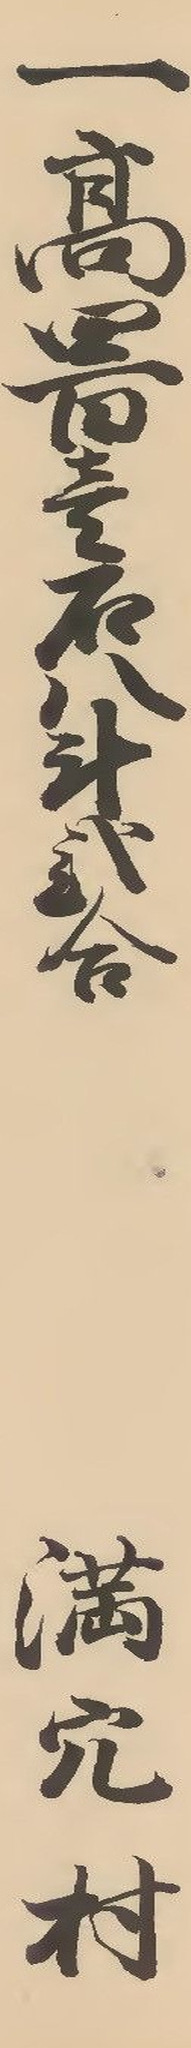一髙四百壱石八斗弐合満穴村
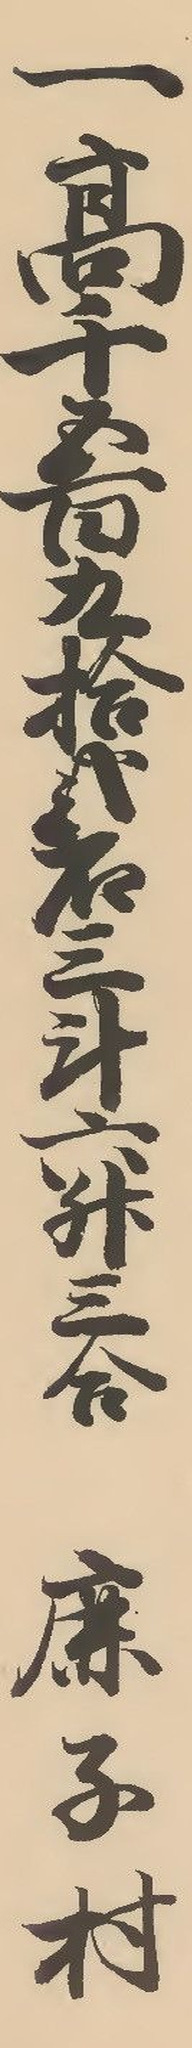一髙千五百九拾弐石三斗六升三合鹿子村

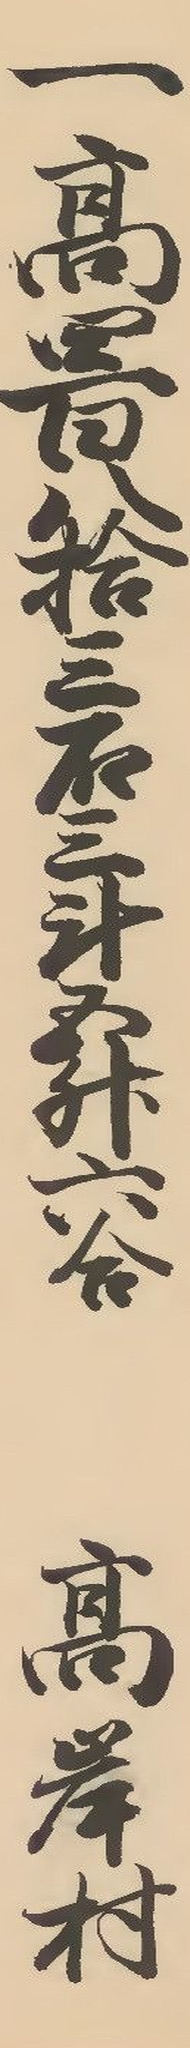一髙四百八拾三石三斗五升六合髙岸村
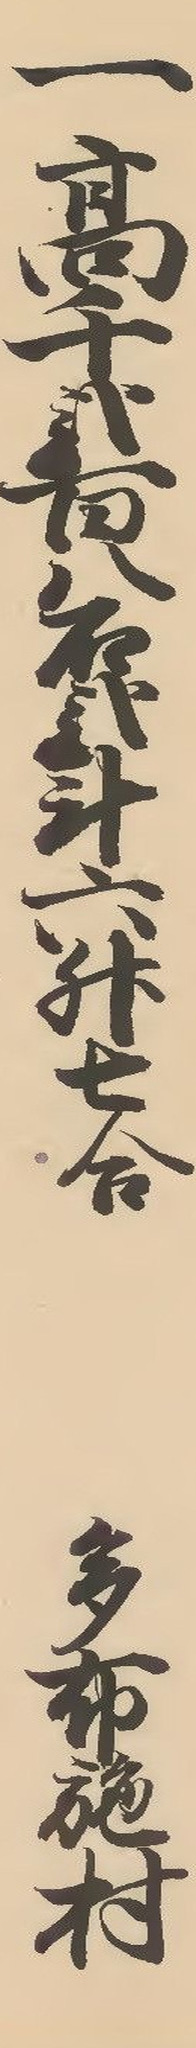一髙千弐百八石弐斗六升七合多布施村
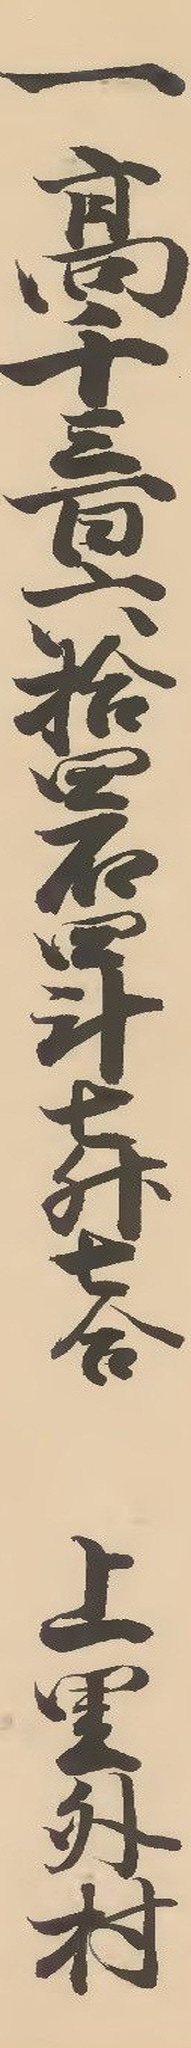一髙千三百六拾四石四斗七升七合上里外村
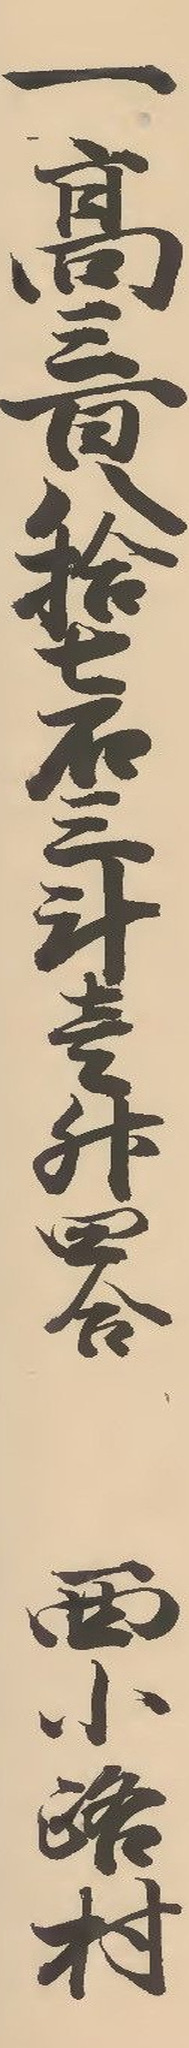一髙三百八拾七石三斗壱升四合西小路村
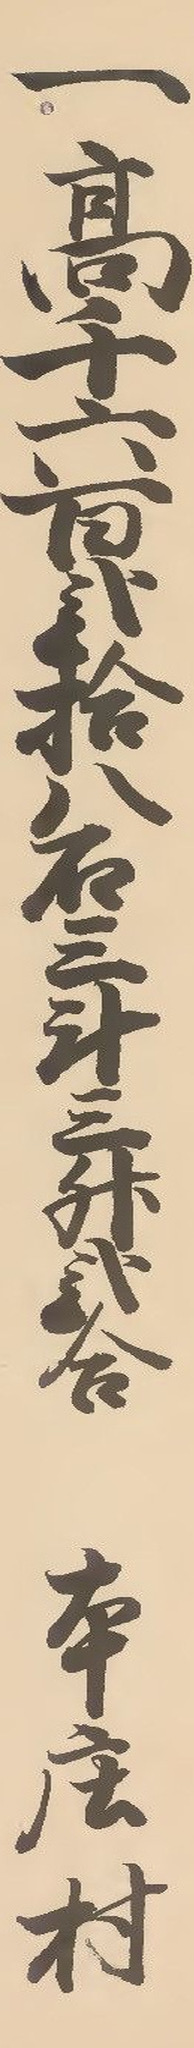一髙千六百弐拾八石三斗三升弐合本庄村
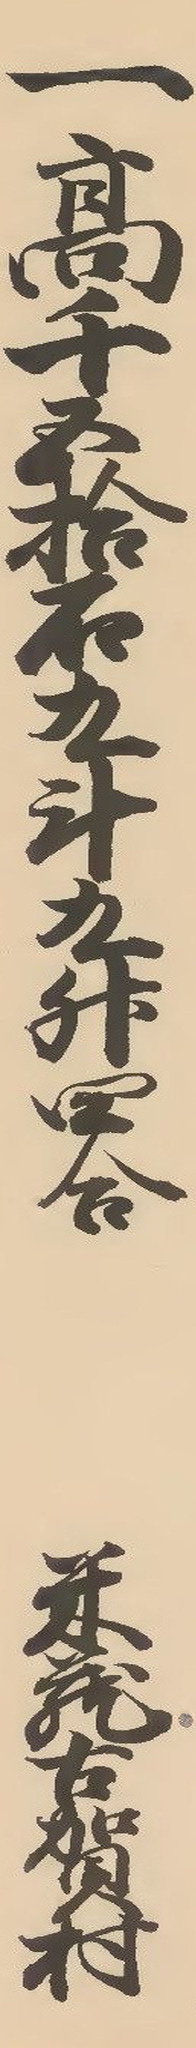一髙千五拾石九斗九升四合米藏古賀村
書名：肥前国郷帳
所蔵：国立公文書館 National Archives of Japan
